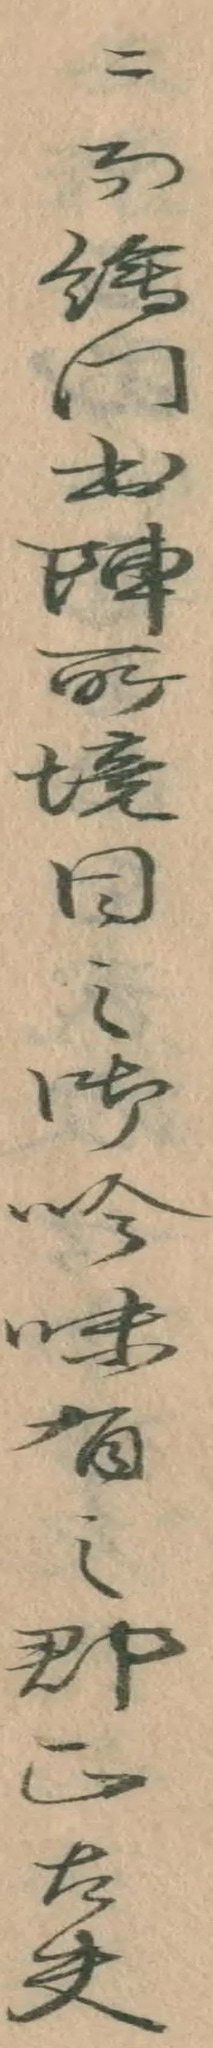に而絵門出陣所境目之御吟味有之郡正太夫
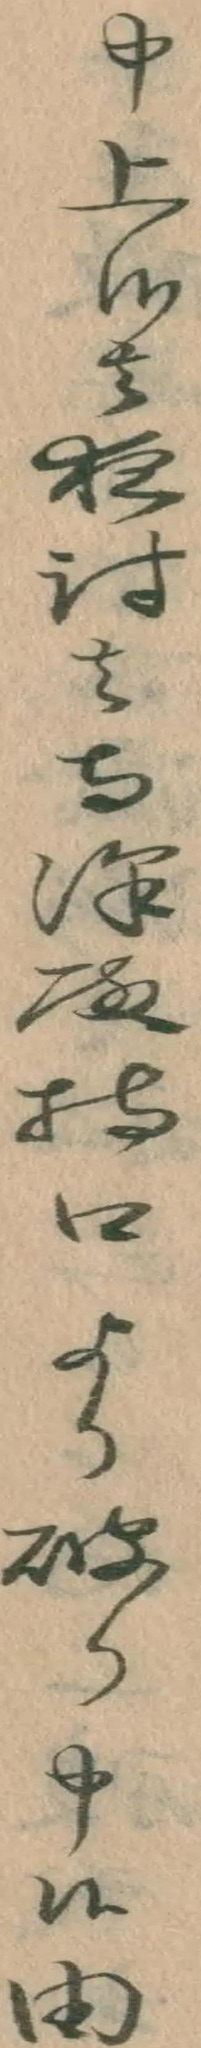申上候者夜討者寺沢殿持口より破り申候由
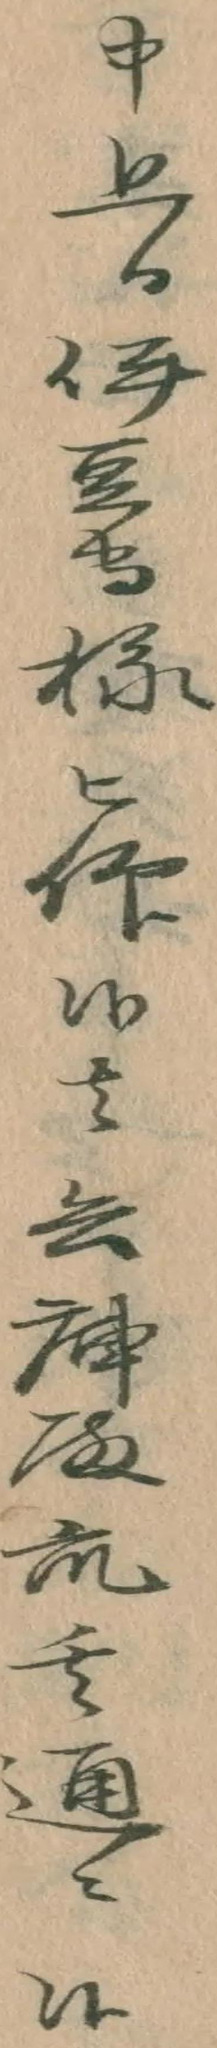申上る伊豆守様被仰候者兵庫殿衆其通に候
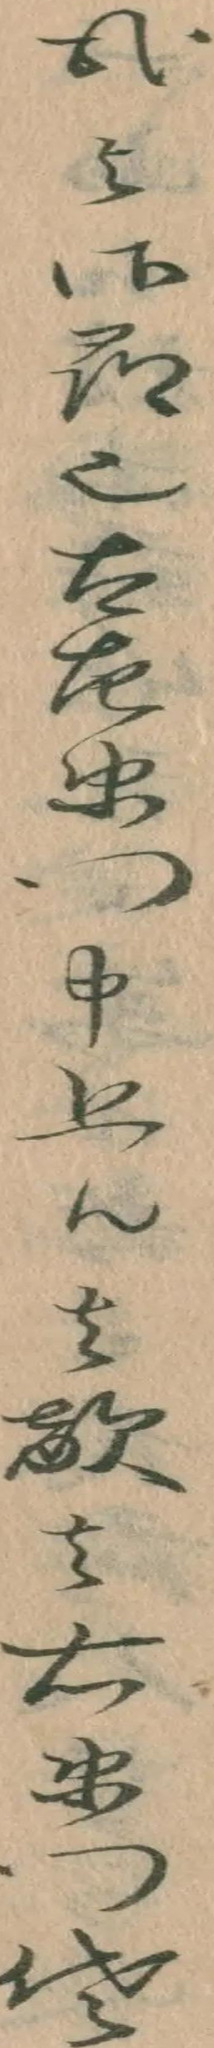哉与御尋也太左衛門申上る者敵者右衛門佐
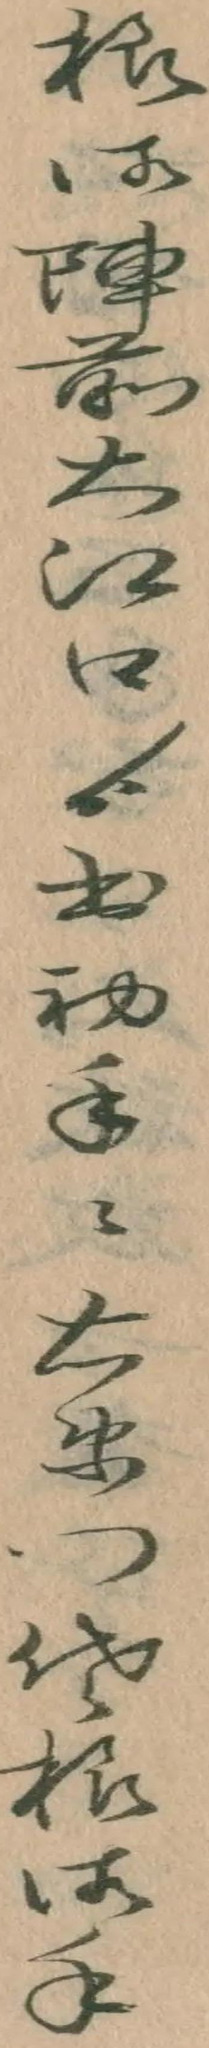様御陣前大江口ゟ出初手に右衛門佐様御手
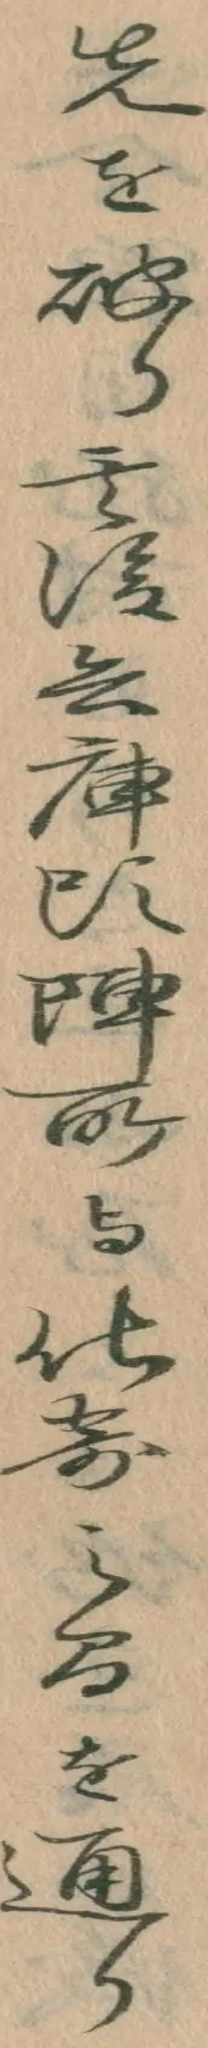先を破り其後兵庫頭陣所与仕寄之間を通り
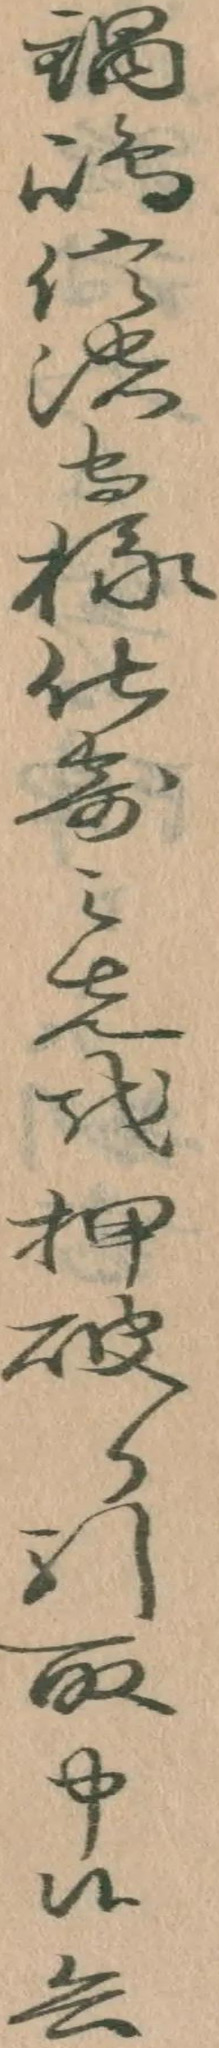鍋島信濃守様仕寄之先越押破り引取申候兵
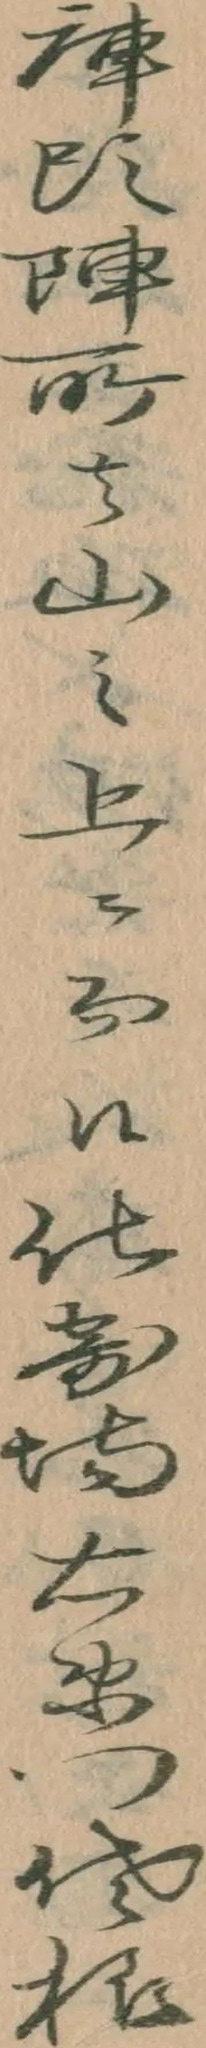庫頭陣所者山之上に而候仕寄場右衛門佐様
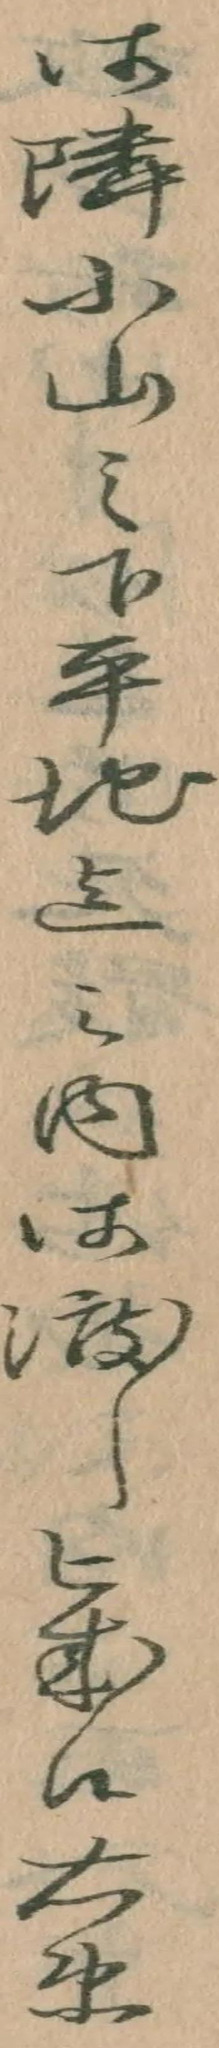御隣小山之下平地迄之内御渡し被成候右衛
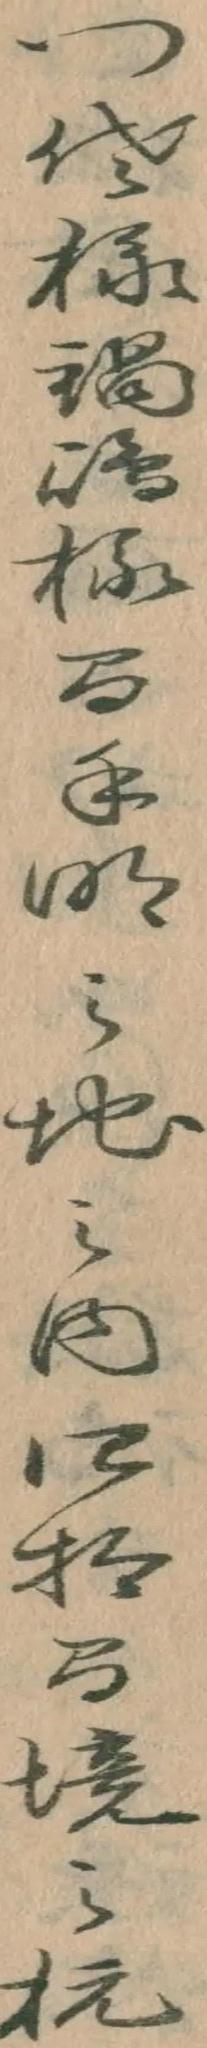門佐様鍋島様間手明之地之内四拾間境之杭
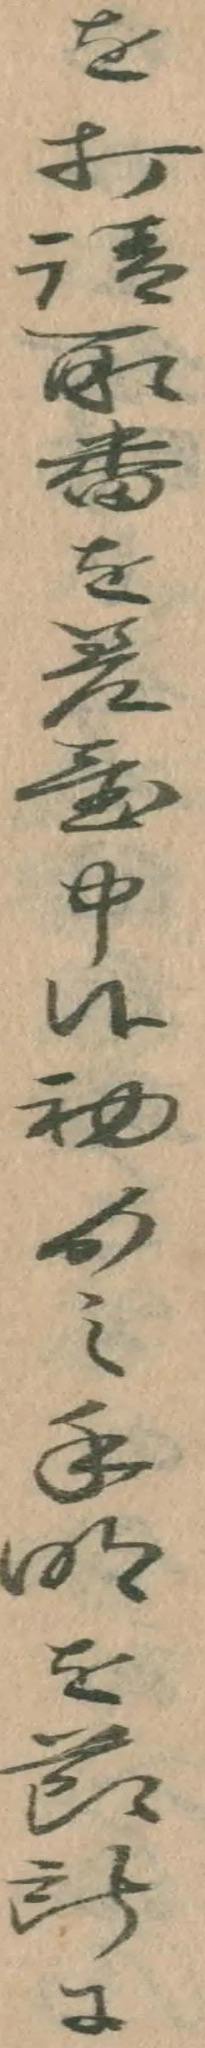を打請取番を差置申候初ゟ之手明を節所尓
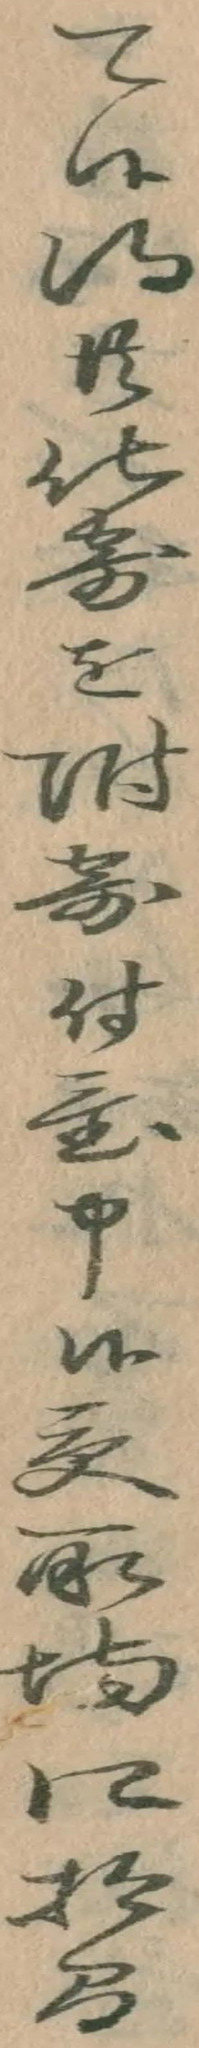て候得共仕寄を附寄付置申候受取場四拾間
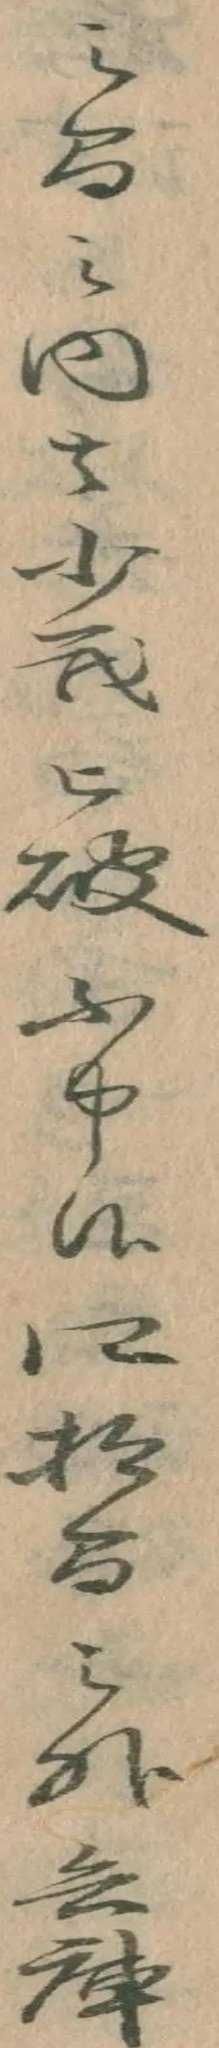之間之内者少茂被破ふ申候四拾間之外兵庫
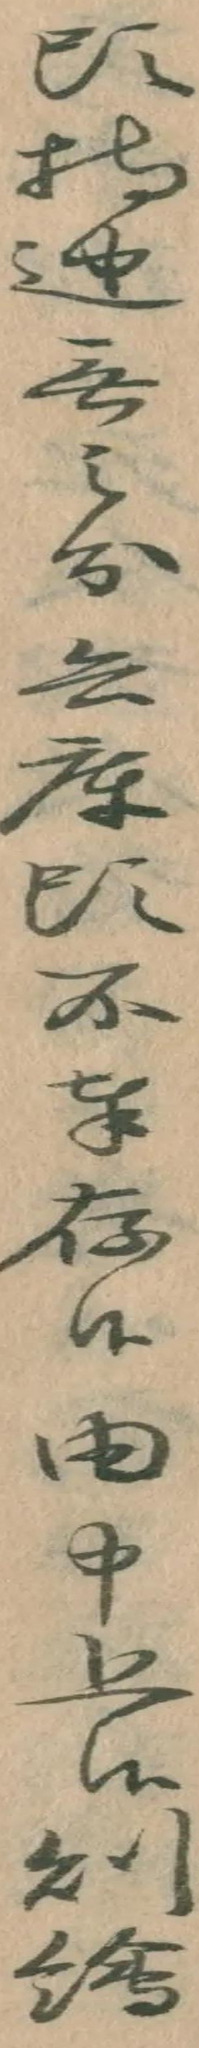頭持迚無之分兵庫頭不奉存候由申上候則絵
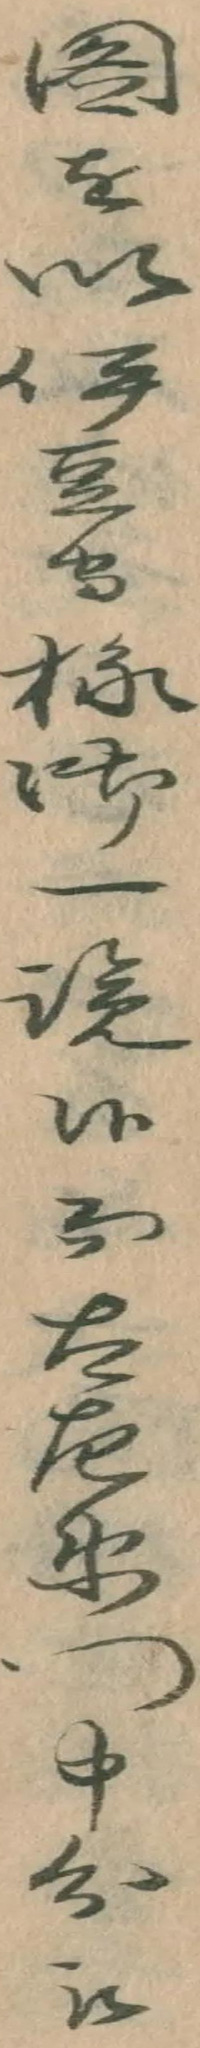図を以伊豆守様御一覧候而太左衛門申分被
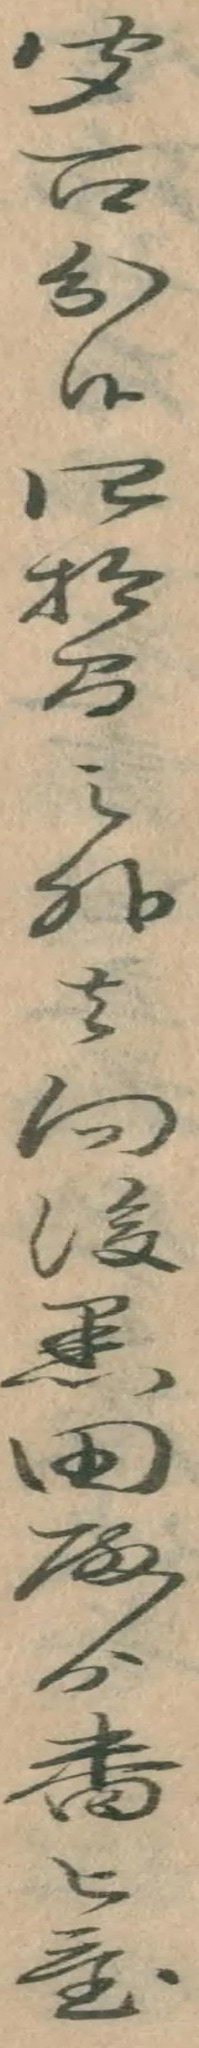聞召分候四拾間之外者向後黒田殿ゟ番被置
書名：切支丹御退治記 49巻. [7]
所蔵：国立国会図書館 National Diet Library, JAPAN
